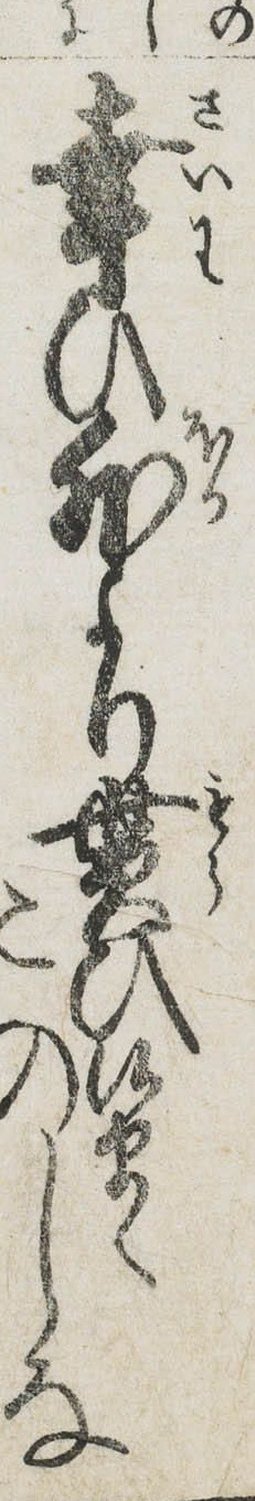幸ひ外より貰ひ候まゝこのしな
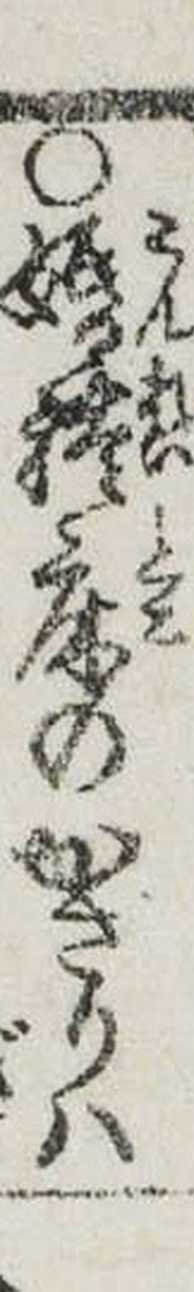○婚礼床のかさりは
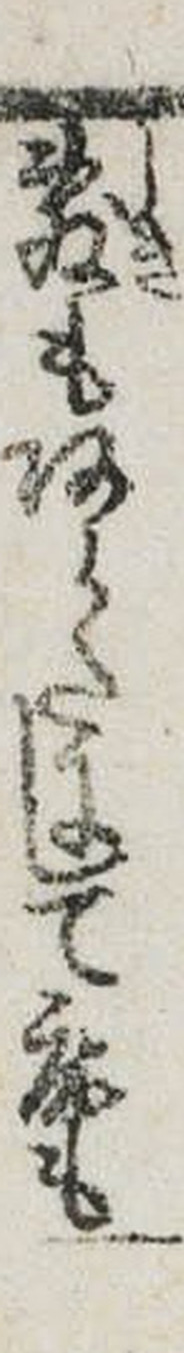敷もあらたにして床も
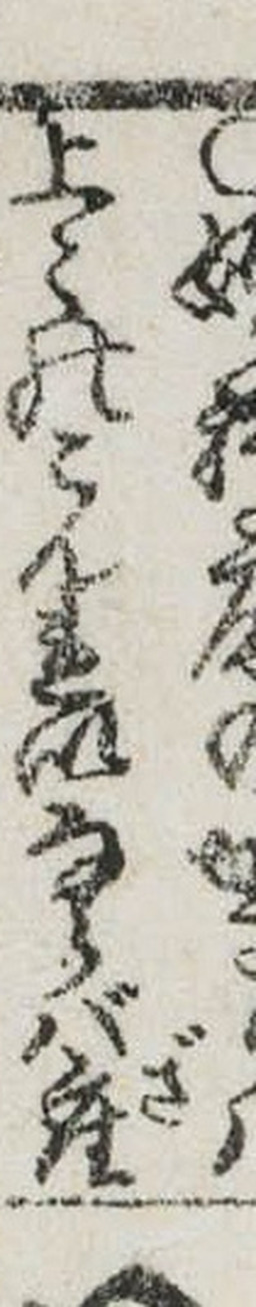上々のこんれいならば座
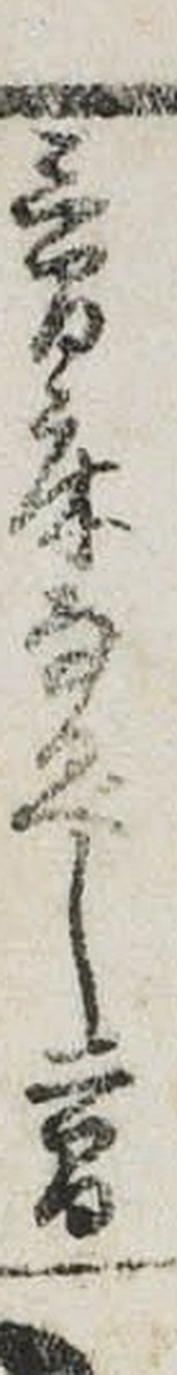三間床なるべし二間
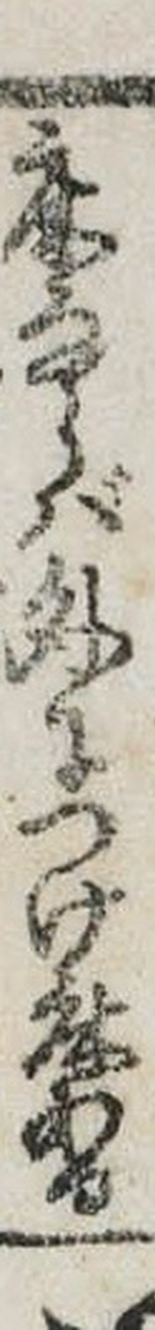床ならば外につけ床ある
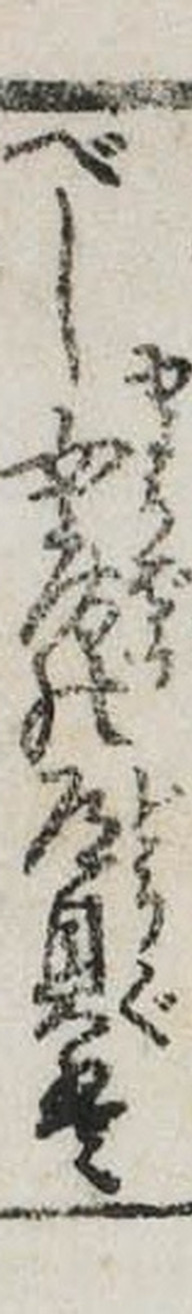べし女房の道具は
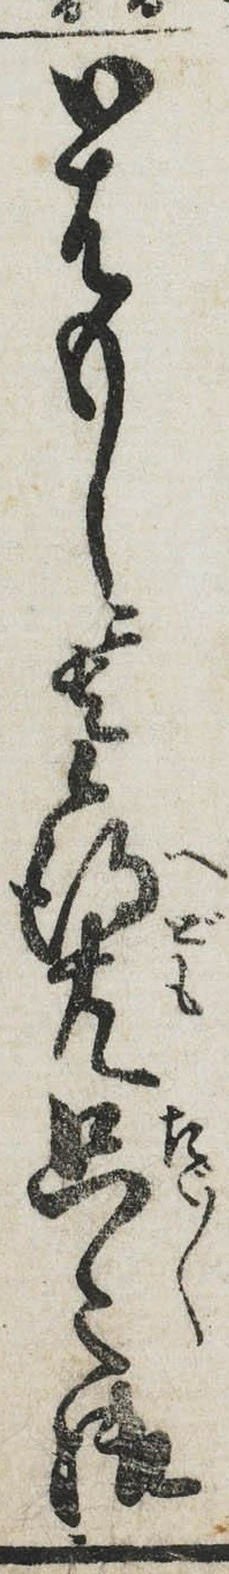御はもしには候得共只々御
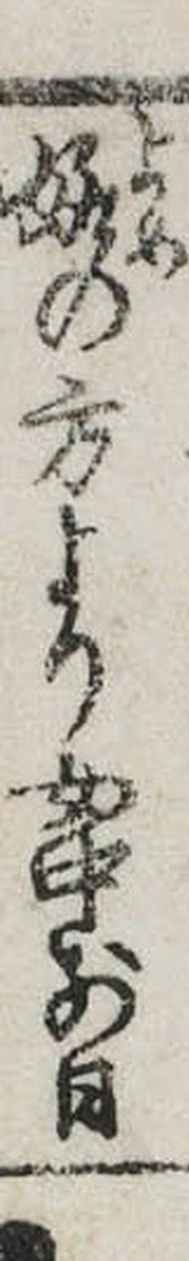娵の方より女中前日
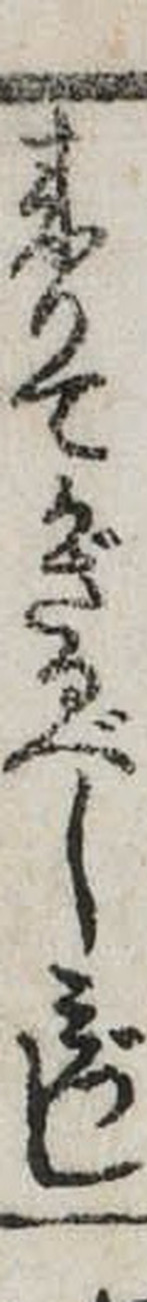来りてかざるべしみづし
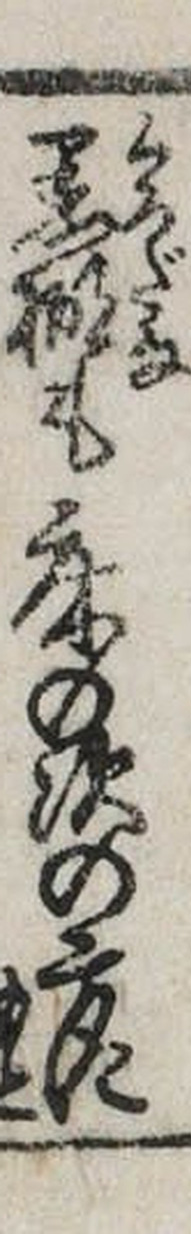黒棚も床の次の方に
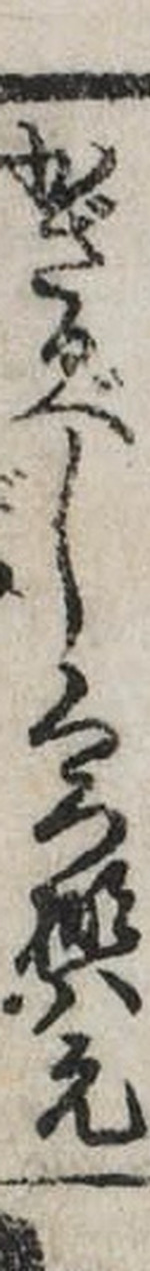かざるべしくろ棚は元
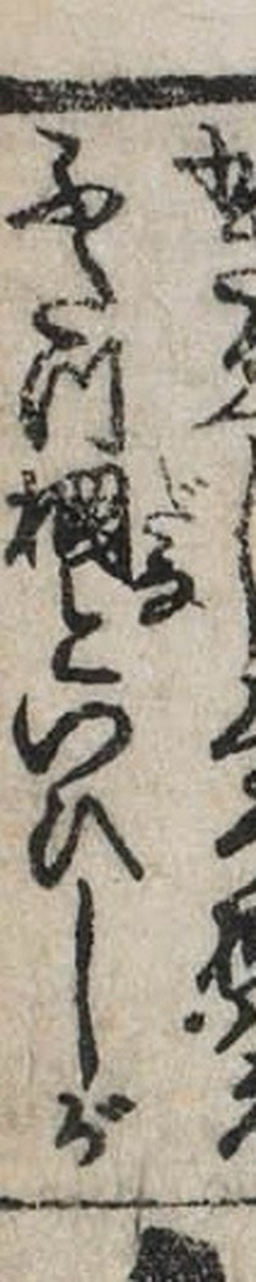ふたつ棚といひしが

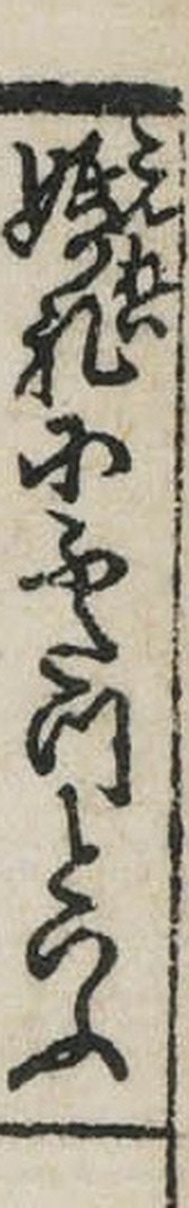婚礼にふたつといふ
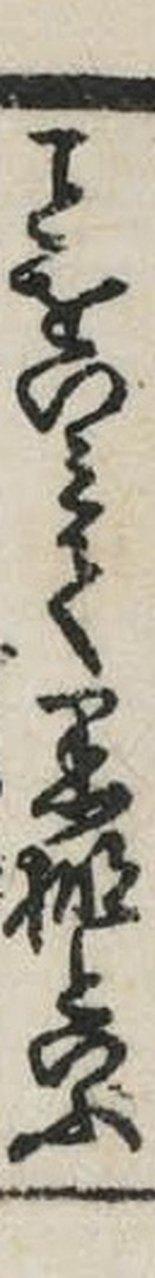ことをいみて黒棚といふ
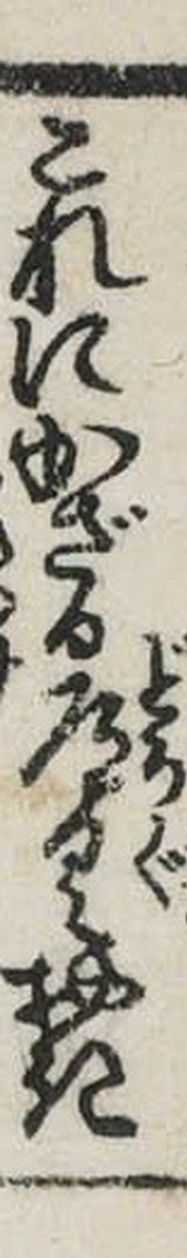これにかざる道具おき
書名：頭書萬用婦人手紙之文言
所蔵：東京学芸大学教育コンテンツアーカイブ
